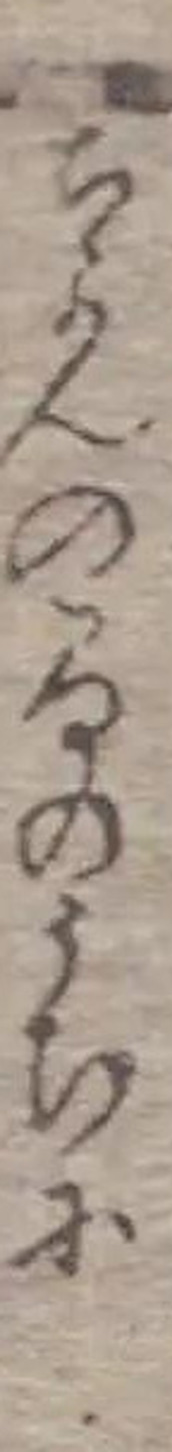ちよんの間のうちに
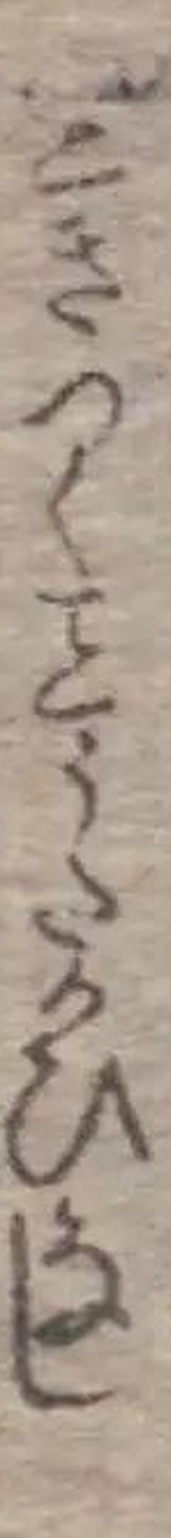ときつく事うたかひなし

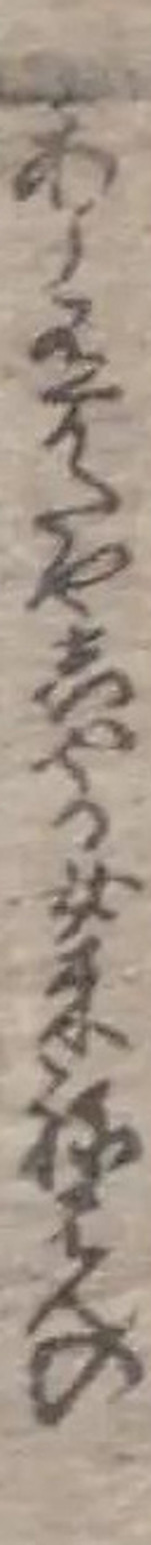あら有かたやしやか女来ねはんの
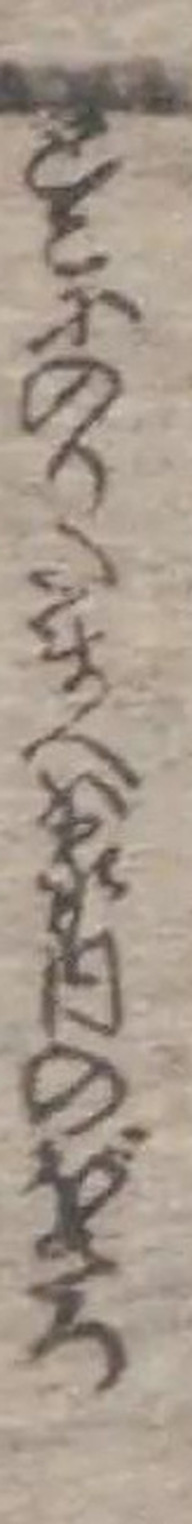とこにのりたまへは家内のぼさつ
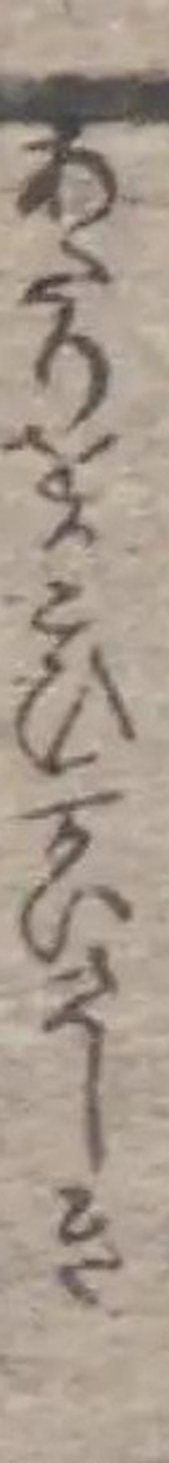あたりをかこひ二かいさしき
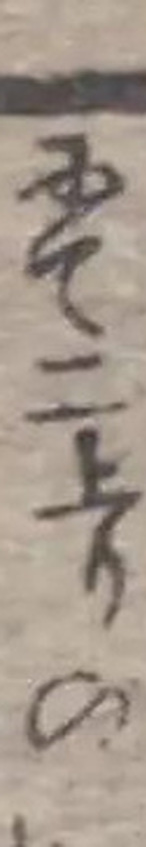にて二上りの
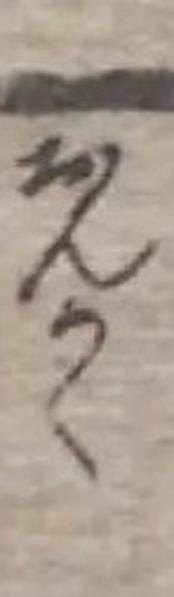おんかく
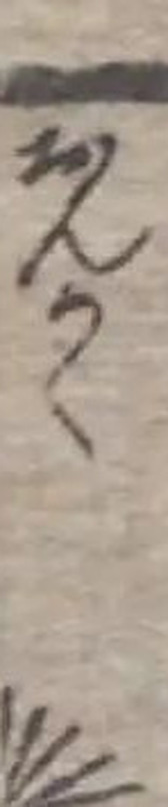おんかく
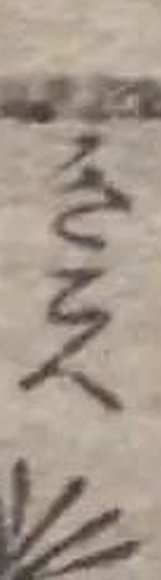きこへ
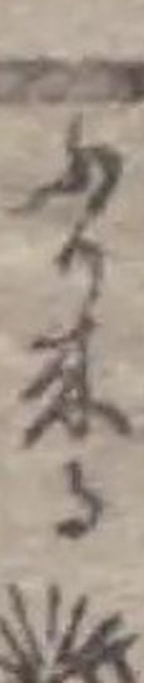ふり来る
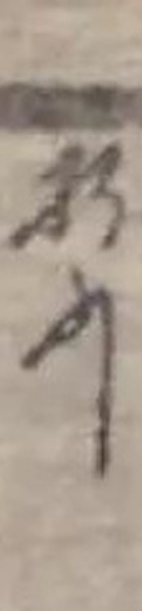折ふし
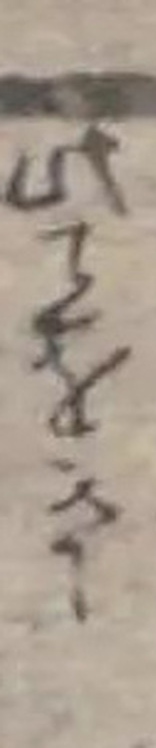此ことをきゝ
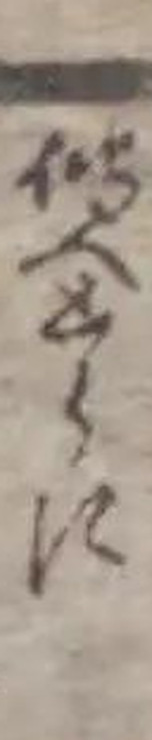伝へとらに
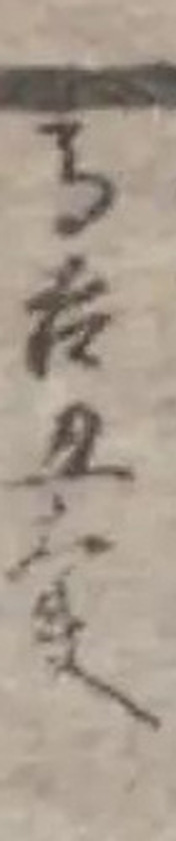馬吉丑太夫
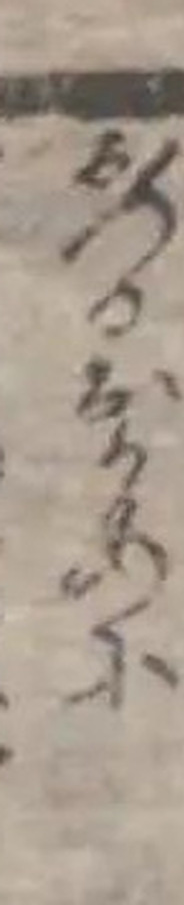おつるおかめに
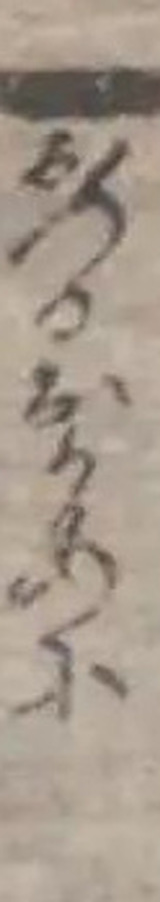おつるおかめに
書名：早出来 3巻
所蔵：国立国会図書館 National Diet Library, JAPAN
